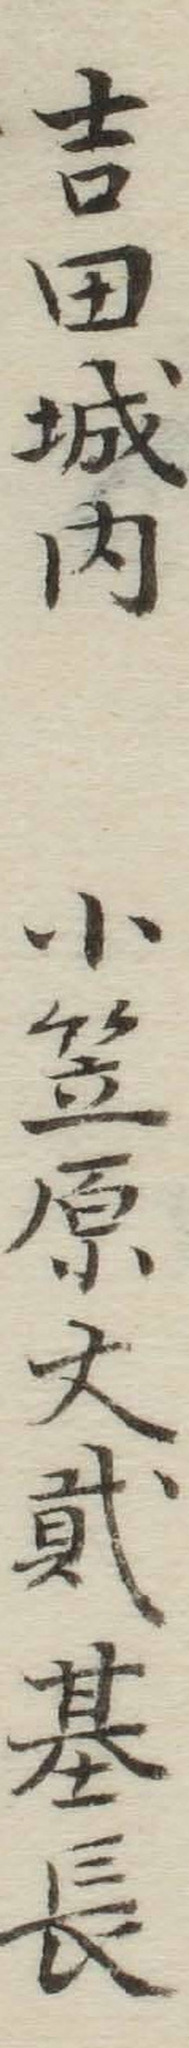吉田城内小笠原大貮基長
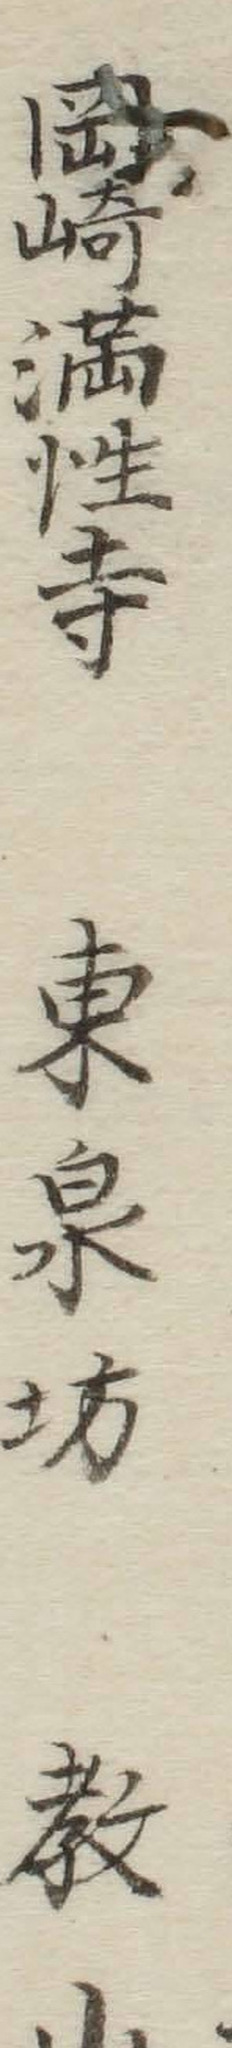岡崎満性寺東泉坊教山
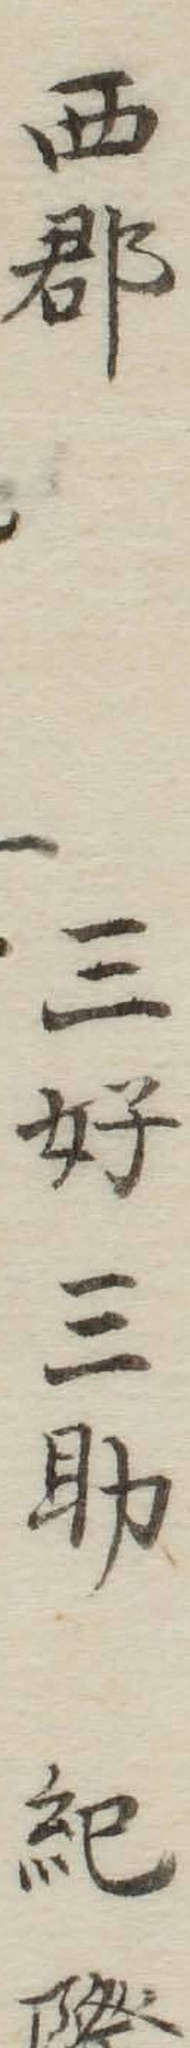西郡三好三助紀隆
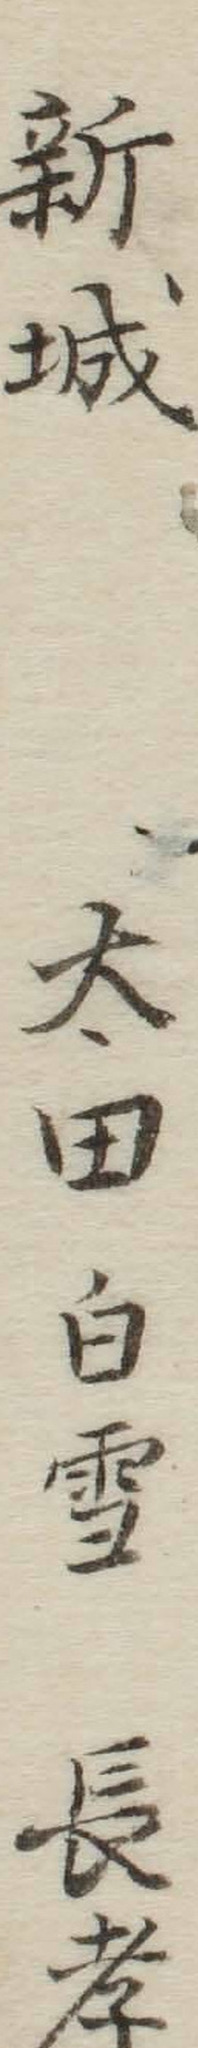新城太田白雪長孝
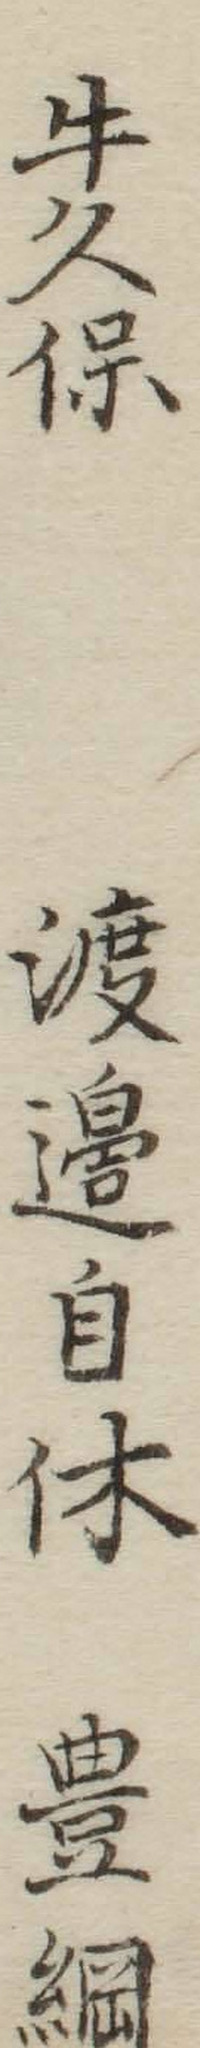牛久保渡邉自休豊綱
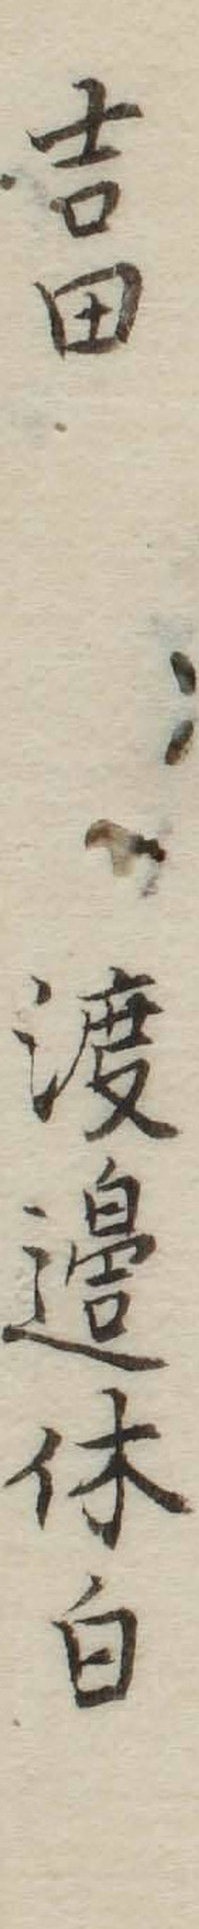吉田渡邉休白竪
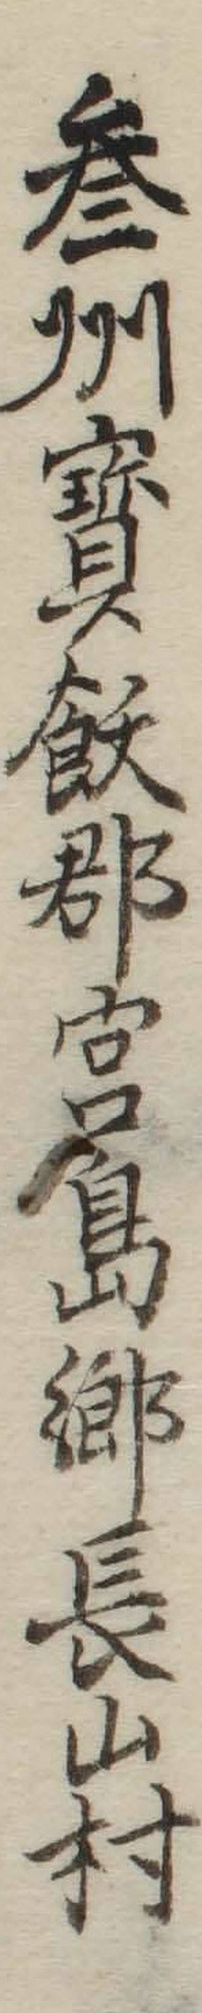参州寶飫郡宮島郷長山村
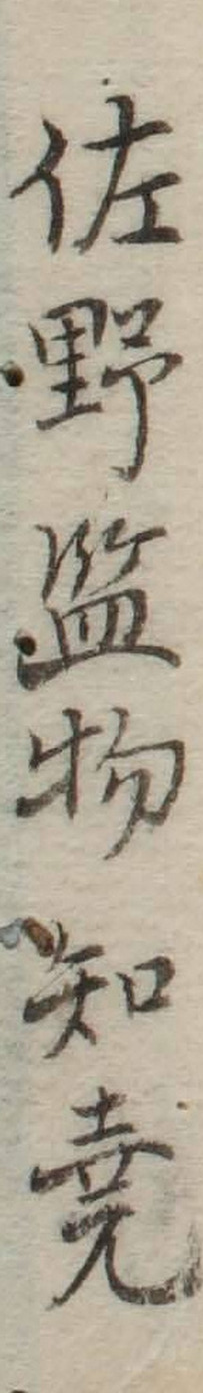佐野監物知尭
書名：三河国二葉松
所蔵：国文学研究資料館
